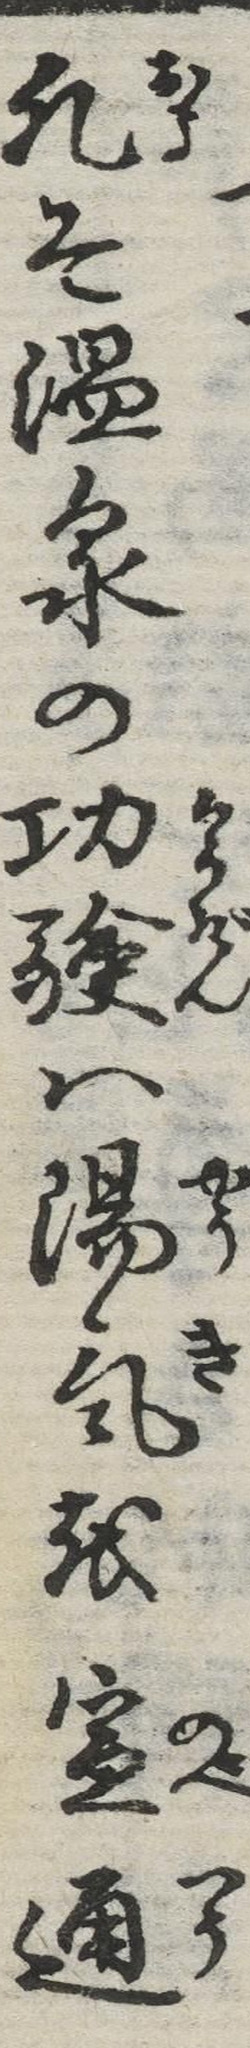凡そ温泉の功験は陽気を宣通

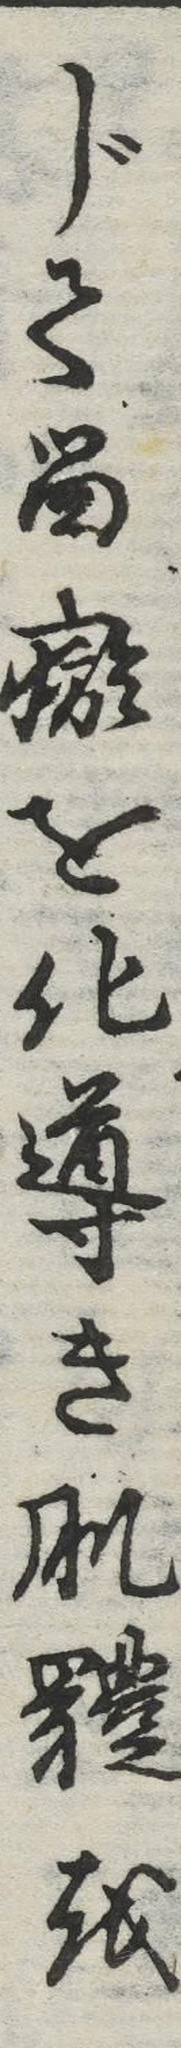じて留瘀を化導き肌體を
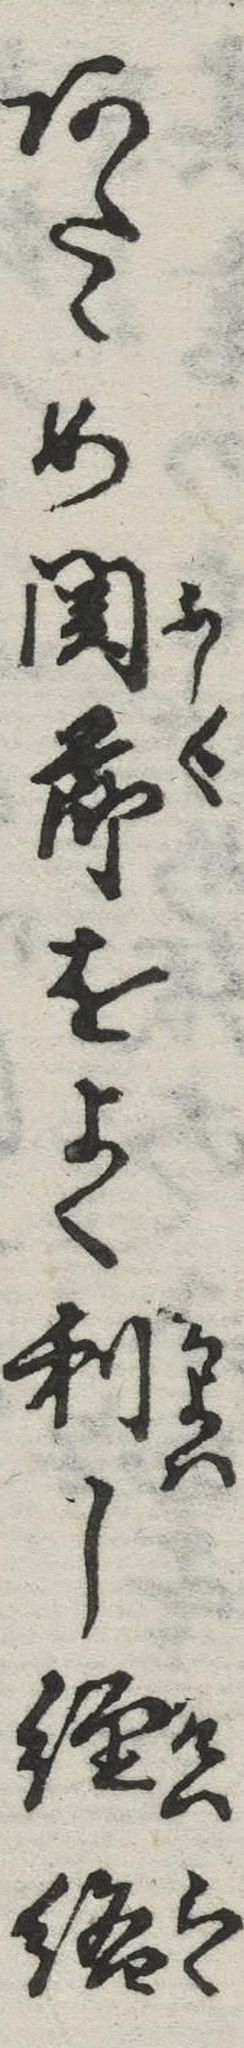あたゝめ関節をよく利し経絡
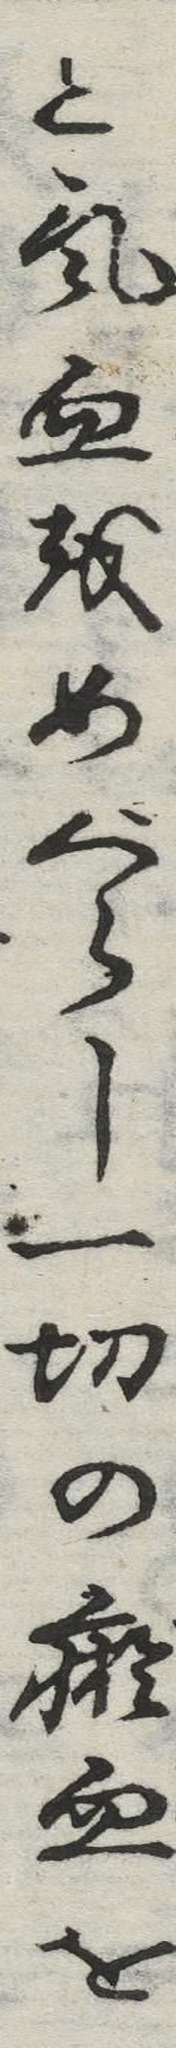と気血をめぐらし一切の瘀血を
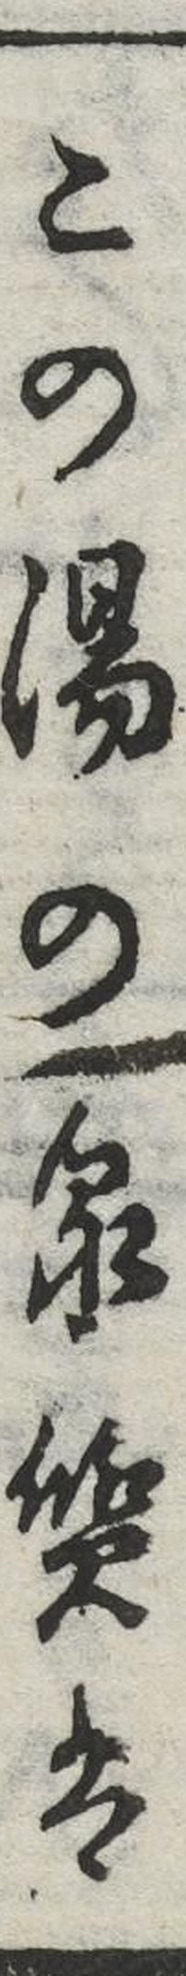この湯の泉質は
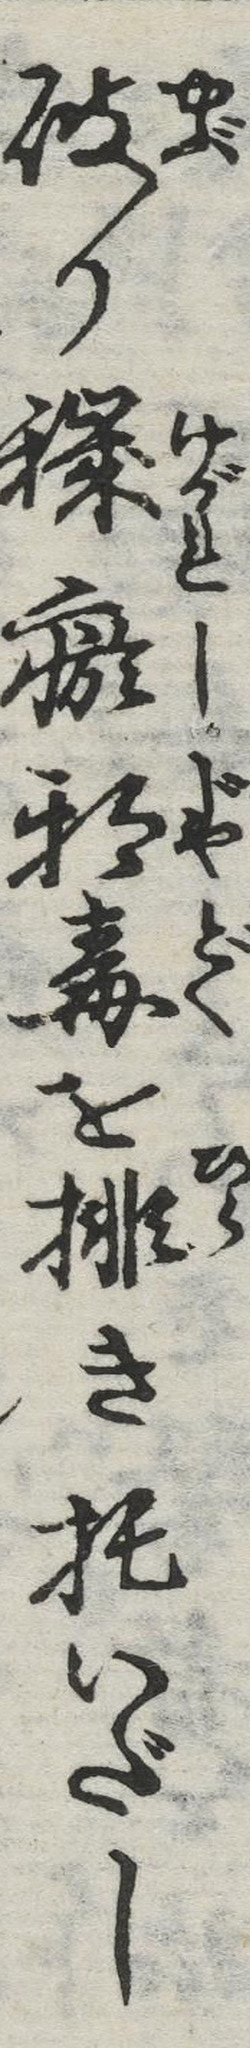破り穢瘀邪毒を排き托いだし
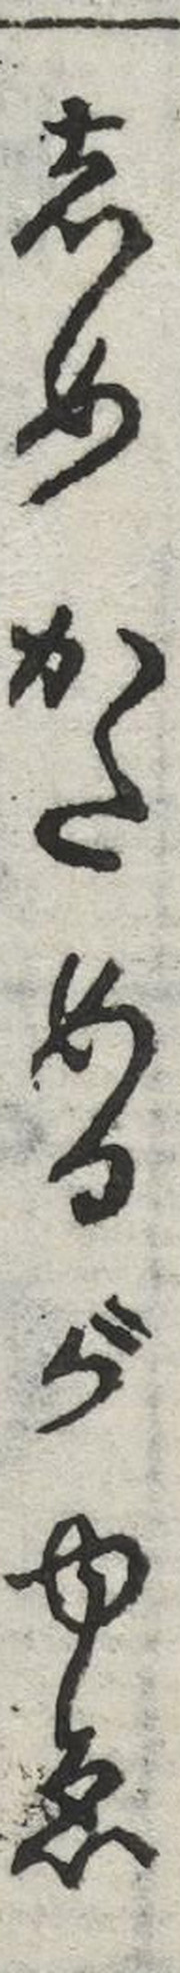しめかためるがゆゑ
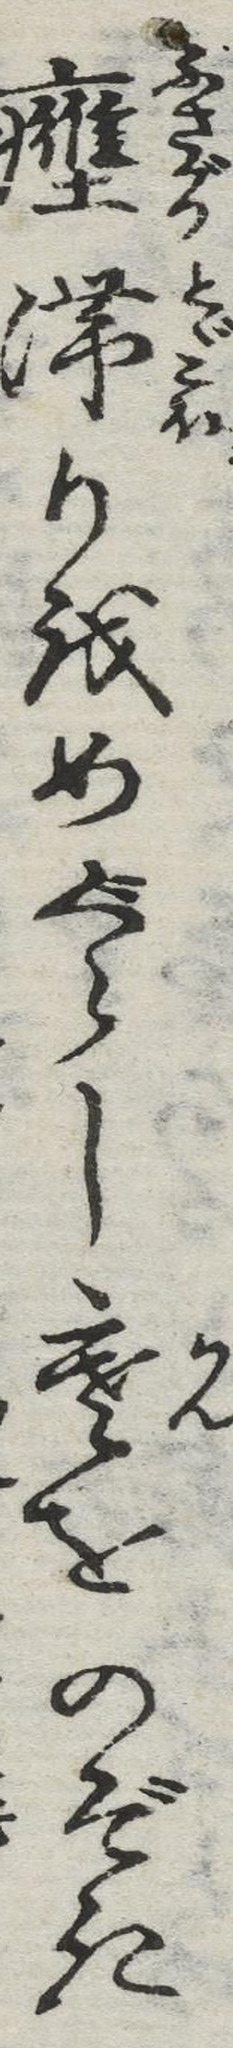癰滞りをめぐらし寒をのぞき
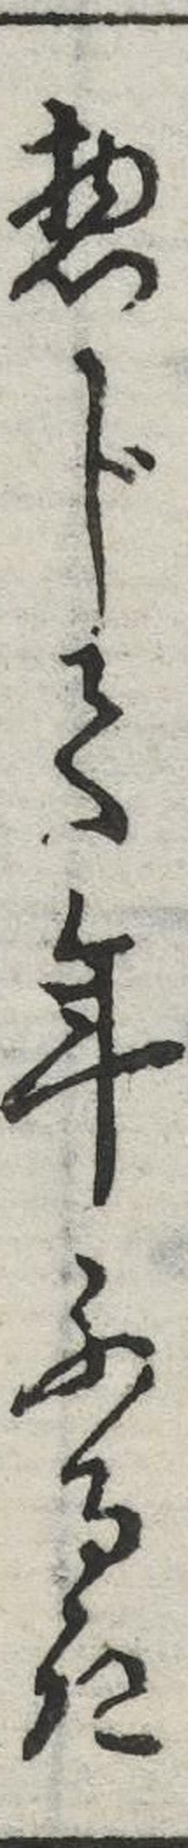惣じて年ふるき
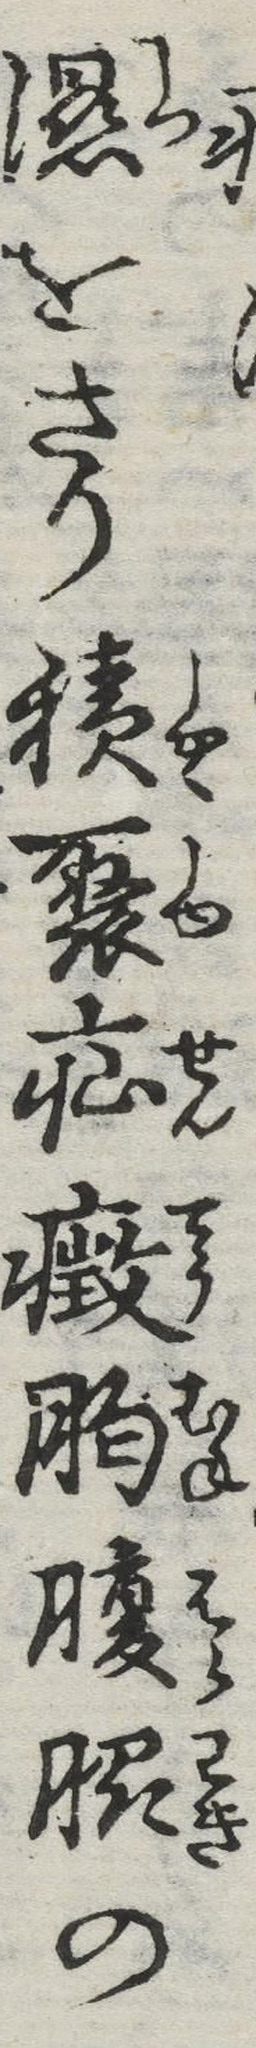濕をさり積聚疝癥胸腹脇の
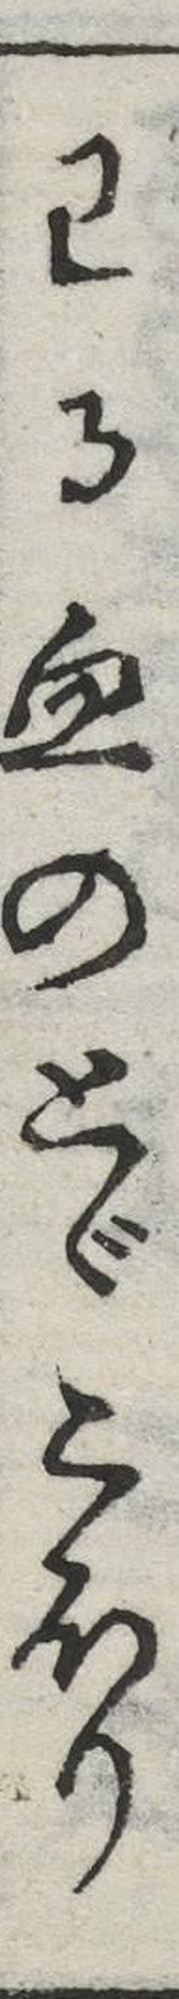わる血のとゞこほり
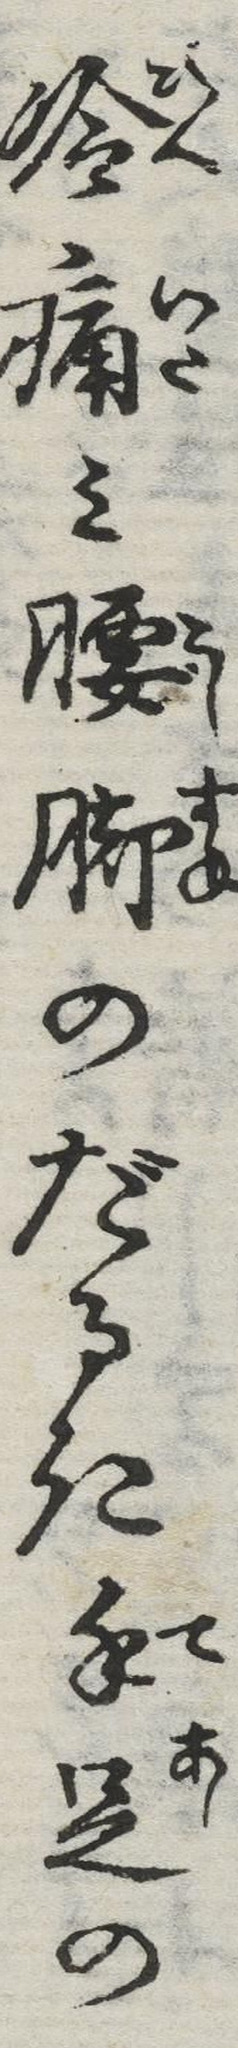冷痛み腰脚のだるき手足の
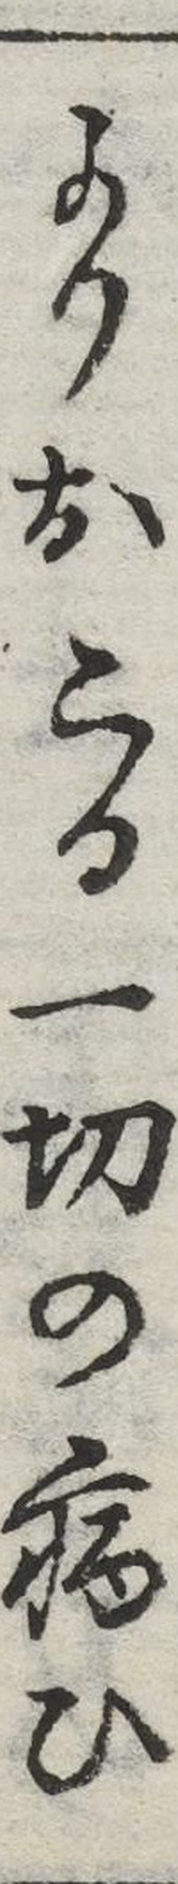よりおこる一切の病ひ
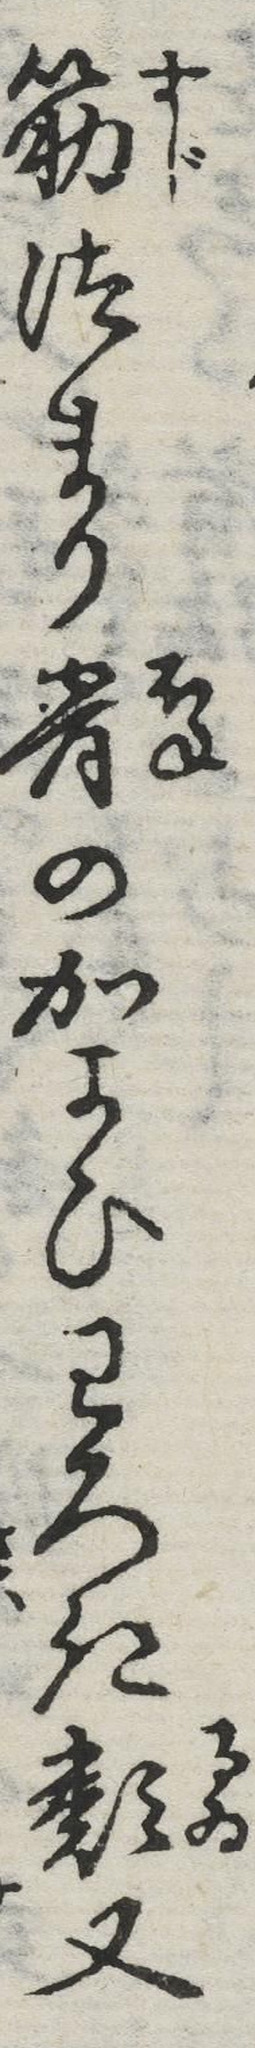筋つまり骨のかよひわろき類又
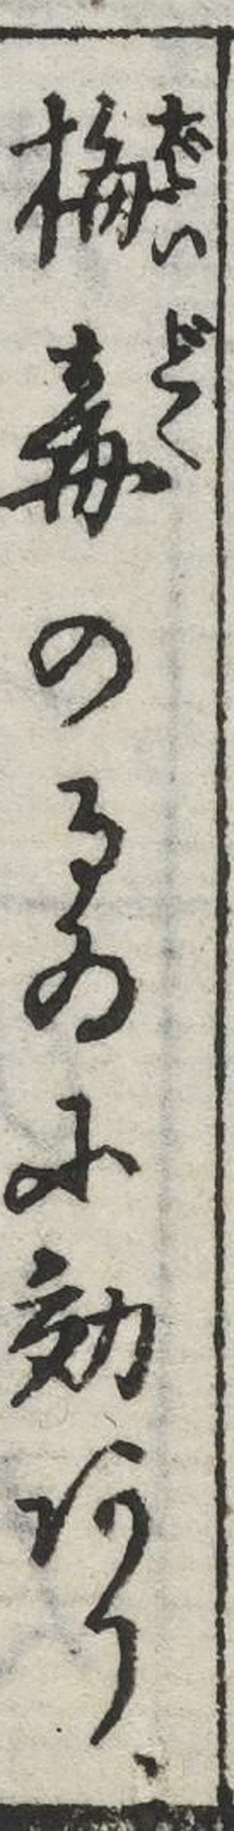梅毒のるゐに効あり、
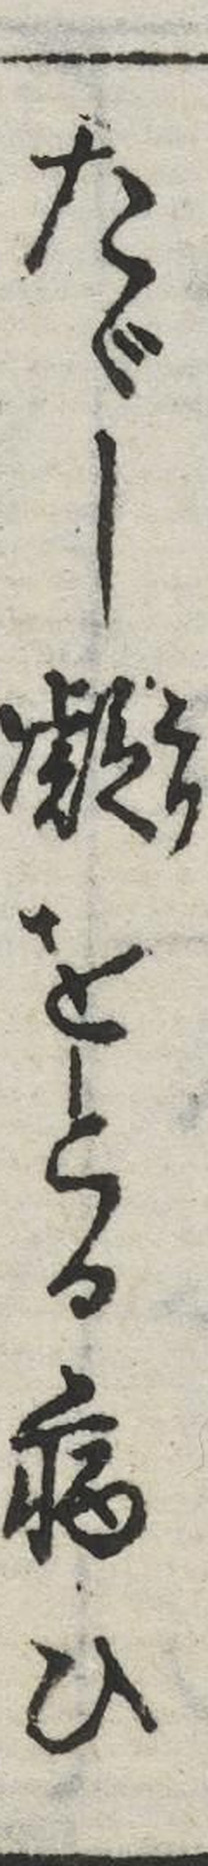たゞし凝をとる病ひ
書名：諸國温泉遊覽記　全
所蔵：東京大学地震研究所図書室 Earthquake Research Institute Library, The University of Tokyo, JAPAN
